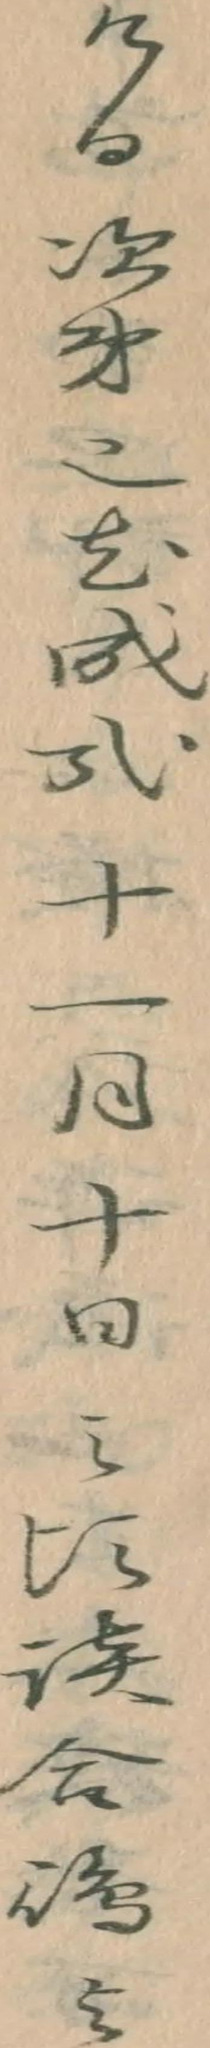ける次第也尤成哉十一月十日之頃談合島と

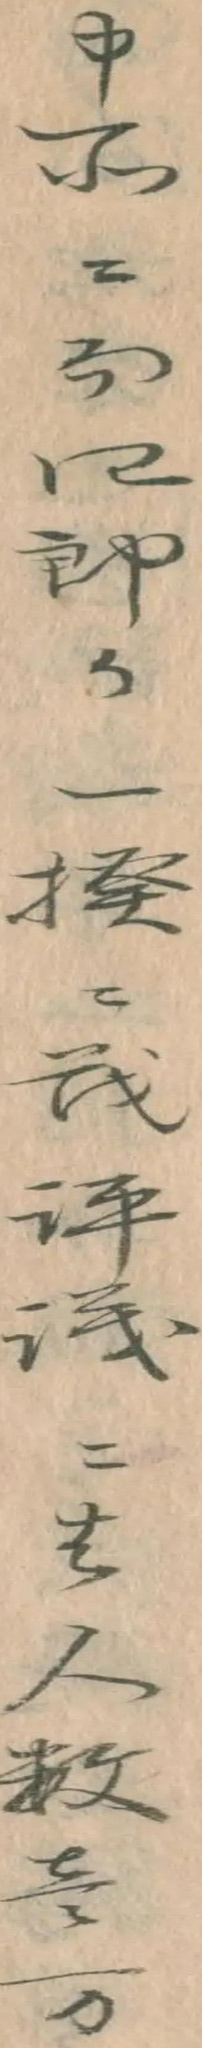申所に而四郎か一揆にも評議には人数壱万
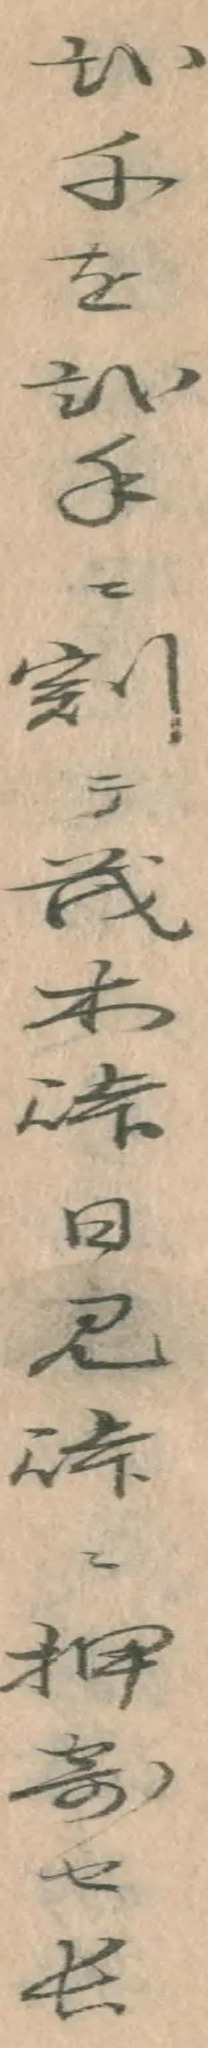弐千を弐手に割テ茂木峠日見峠に押寄セ長
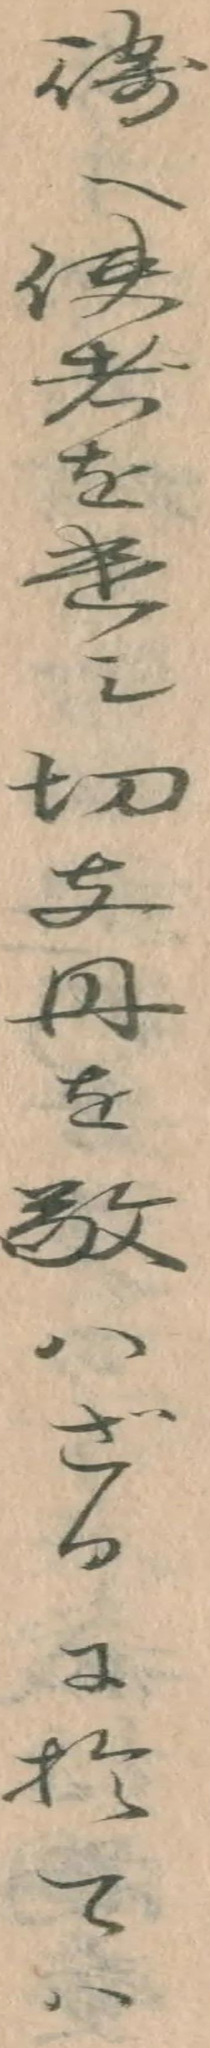崎へ使者を遣シ切支丹を敬はざるに於ては
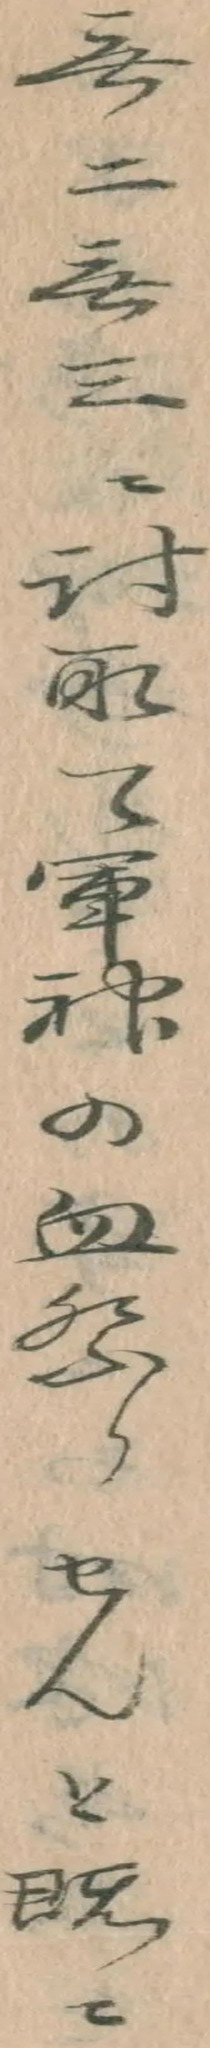無二無三に討取て軍神の血祭りセんと既に
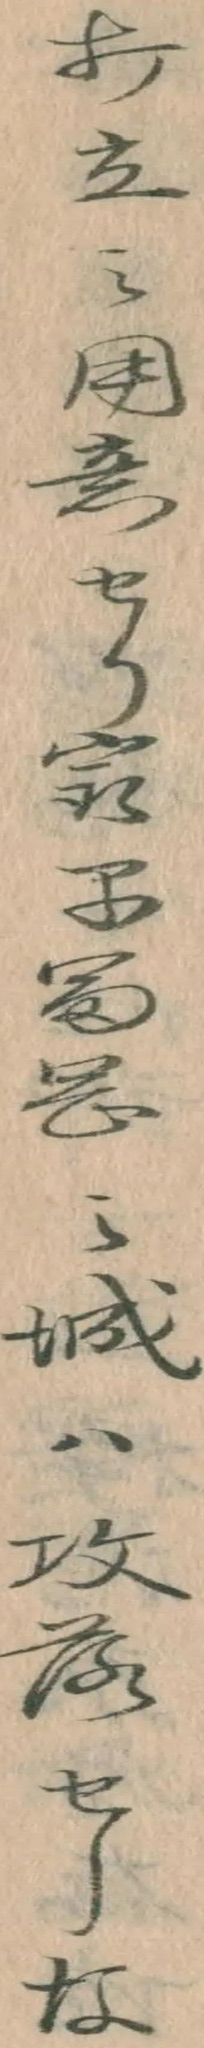打立之用意セり最早富岡之城は攻落セしな
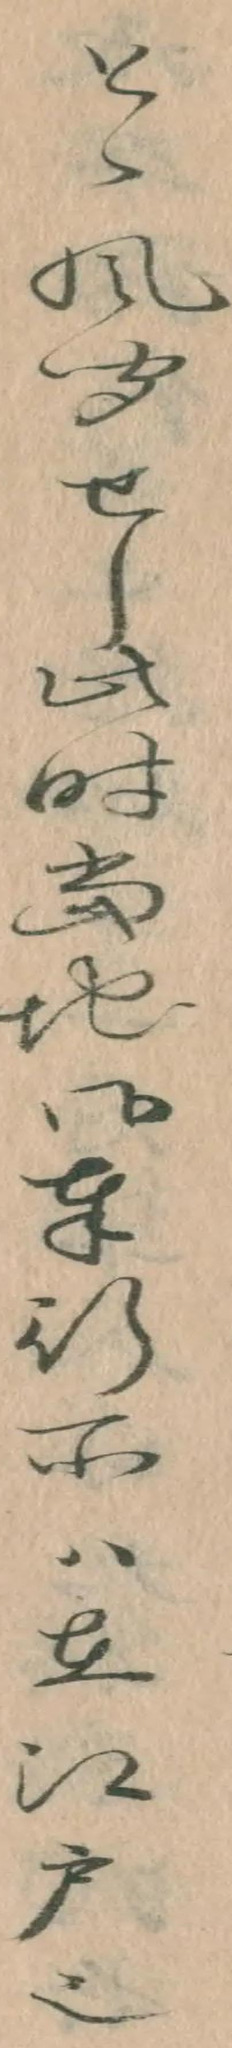とゝ風聞せし此時当地御奉行所は在江戸也
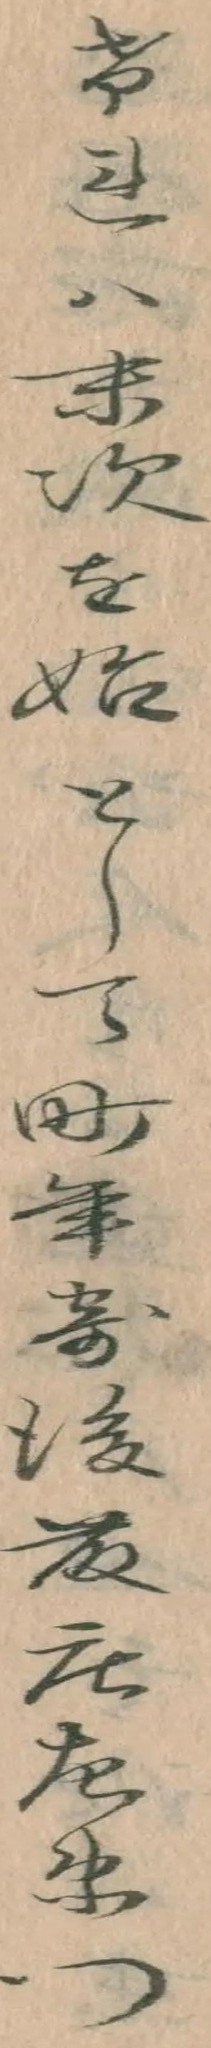けれは末次を始として町年寄後藤庄左衛門
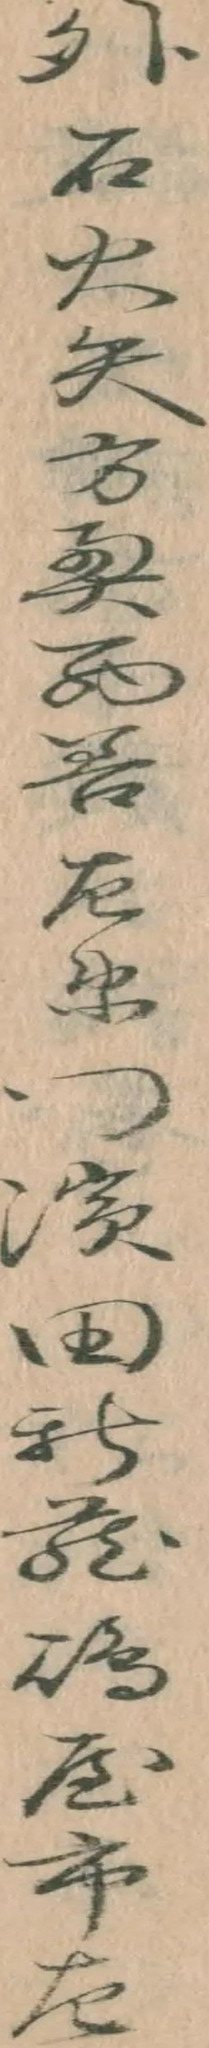外石火矢方奥西善左衛門浜田新蔵島屋市左
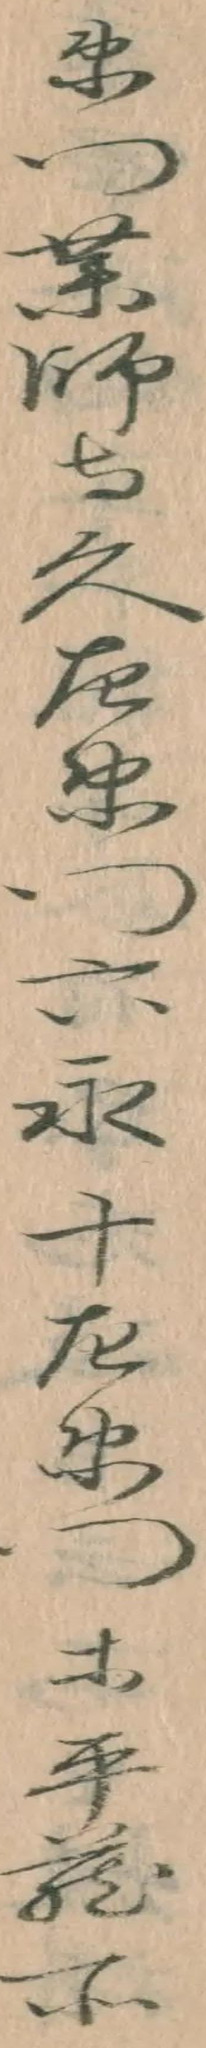衛門薬師寺久左衛門六永十左衛門等平蔵所
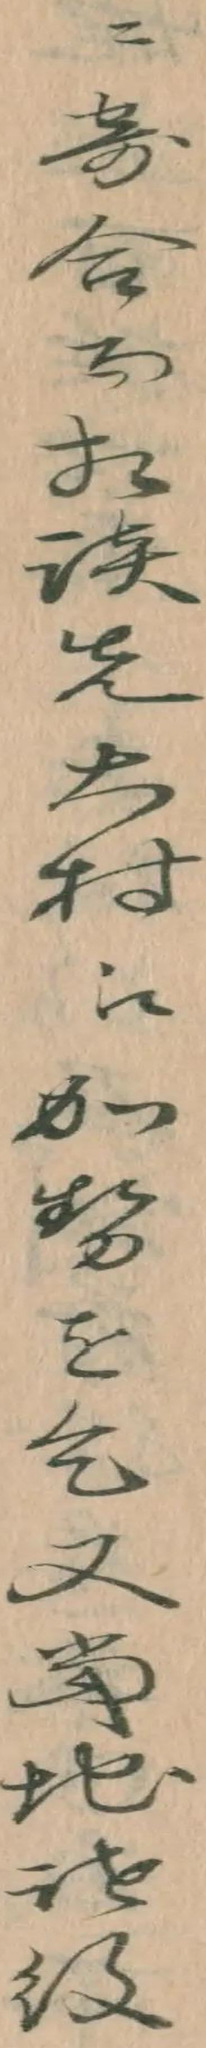に寄合而相談先大村江加勢を乞又当地諸役
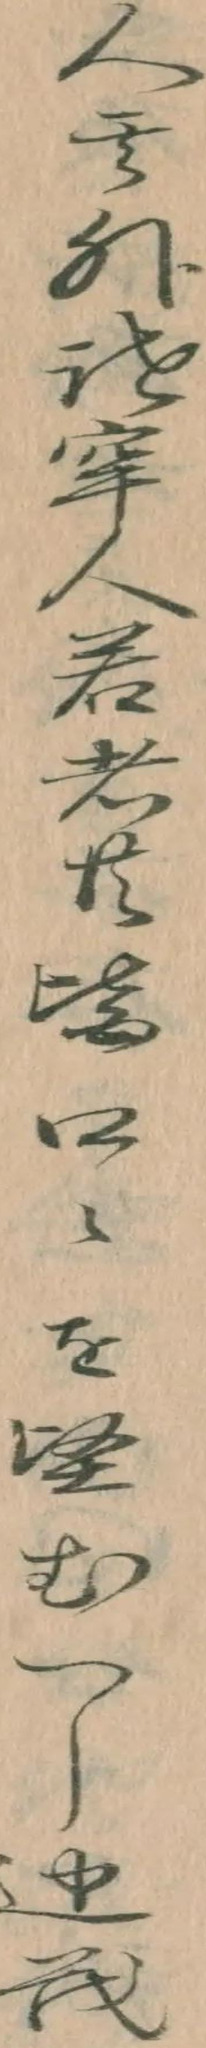人其外諸牢人若者共皆口々を堅むへし迚茂
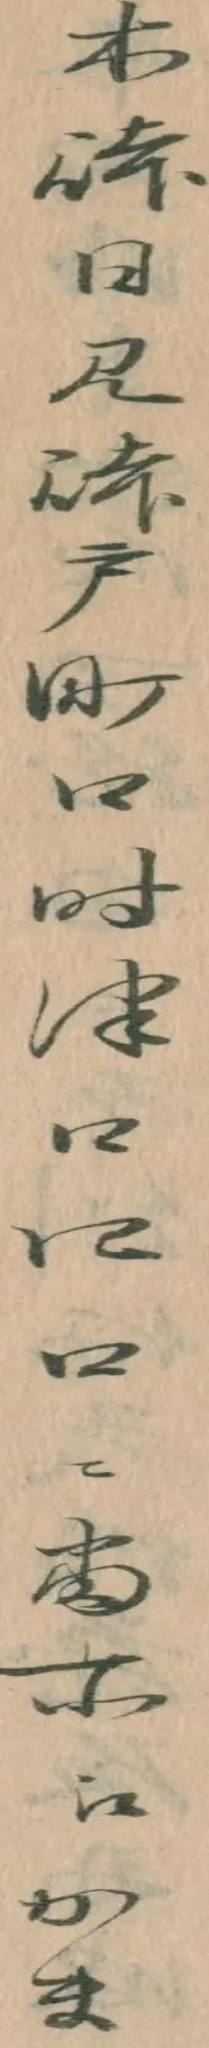木峠日見峠戸町口時津口四口に番所江かま
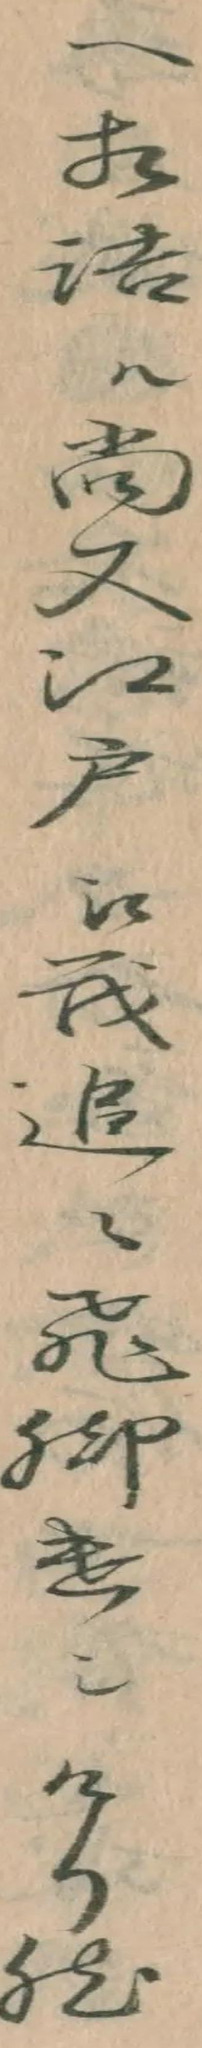へ相詰ル尚又江戸江も追々飛脚遣シけり然
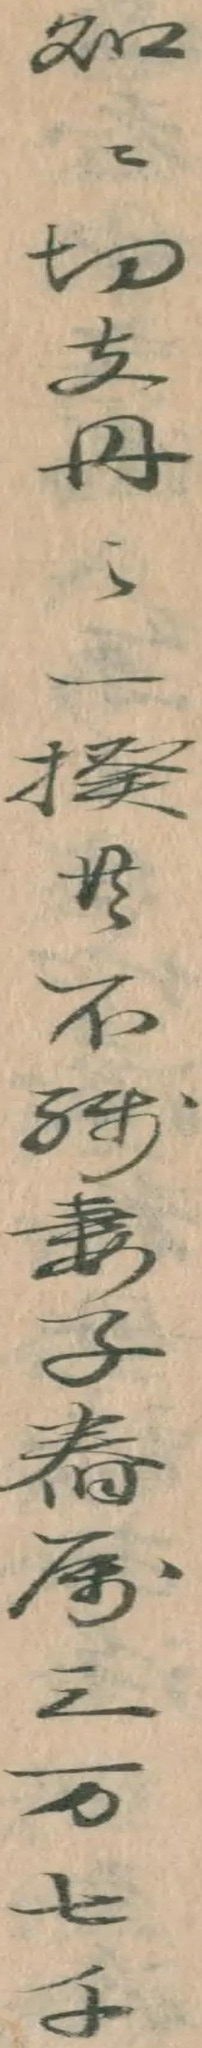処に切支丹之一揆共不残妻子㫪属三万七千
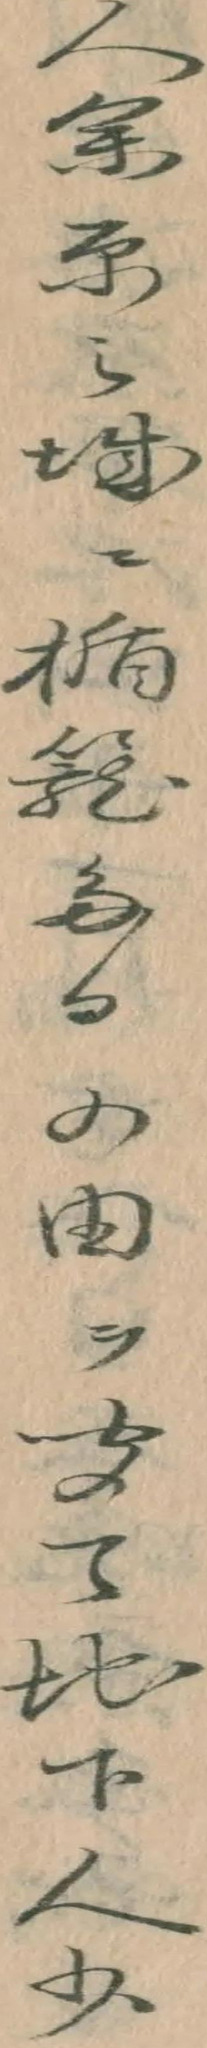人余原之城に楯籠たるの由ヲ聞て地下人少
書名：切支丹御退治記 49巻. [3]
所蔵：国立国会図書館 National Diet Library, JAPAN
